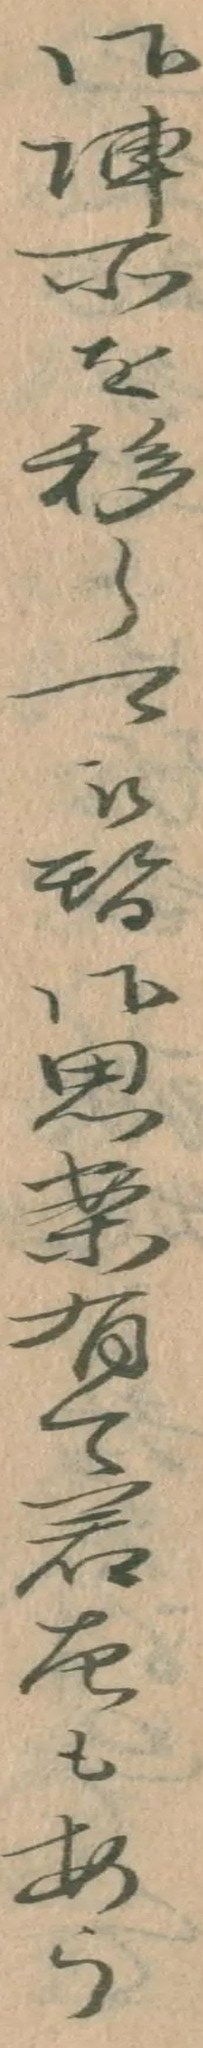御陣所を移して被替御思案有て若左もあら
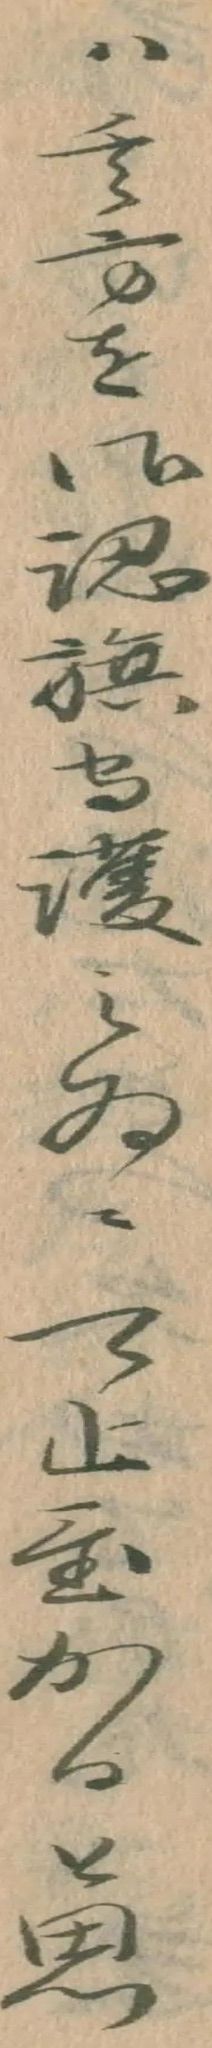は其方を御認旗守護之ゐにて止置かると思
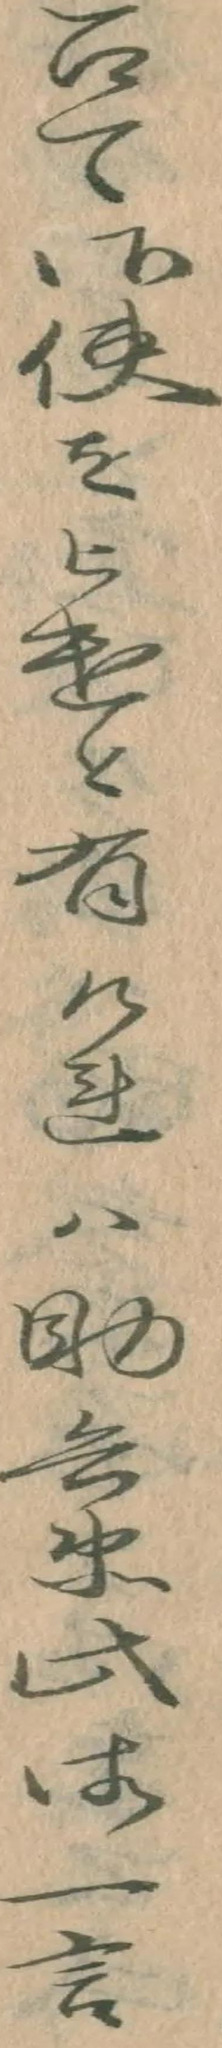召て御使を被遣と有け連は助兵衛此御一言
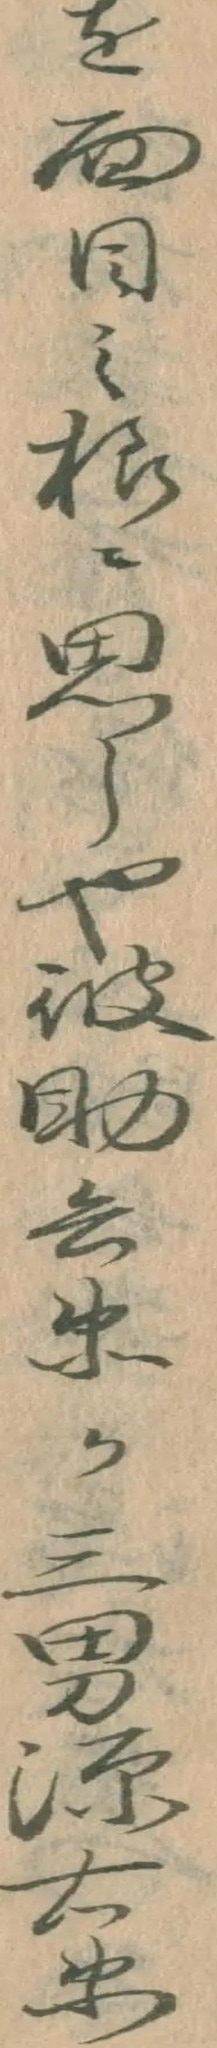を面目之様に思し也彼助兵衛か三男源右衛
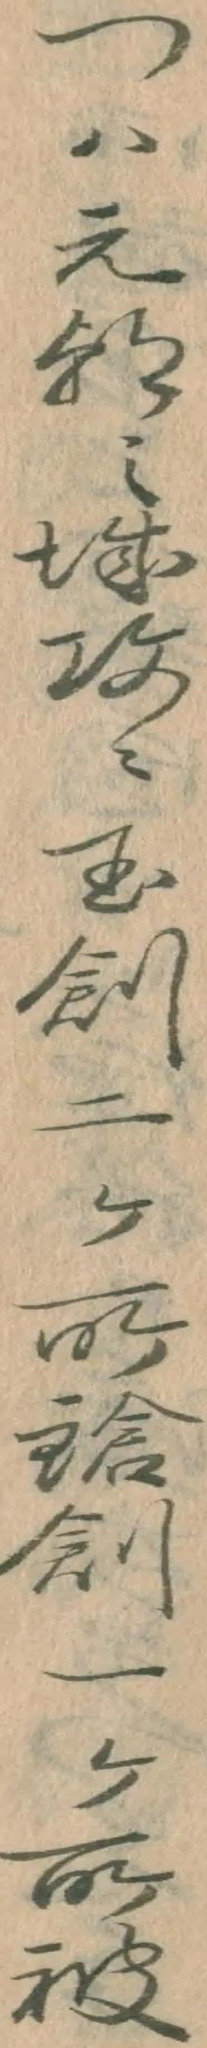門は元朝之城攻に至創二け所鎗創一け所被
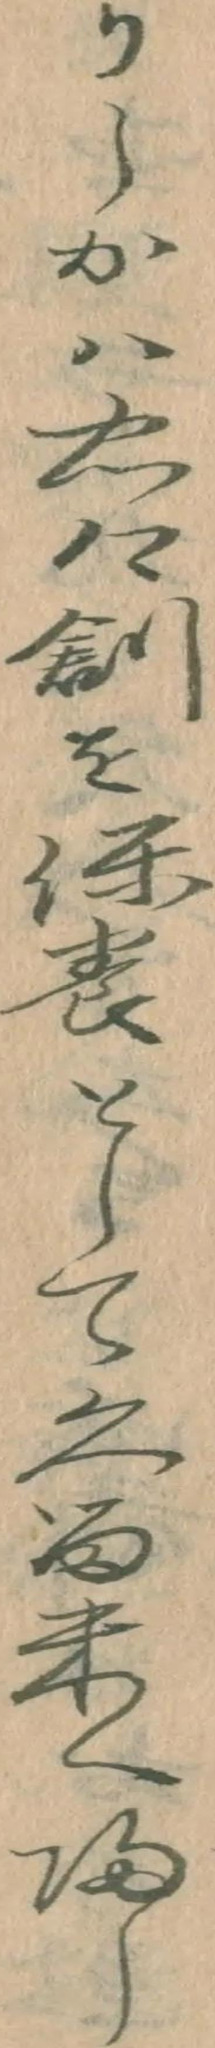りしかは忠郷創を保養として久留米へ帰し
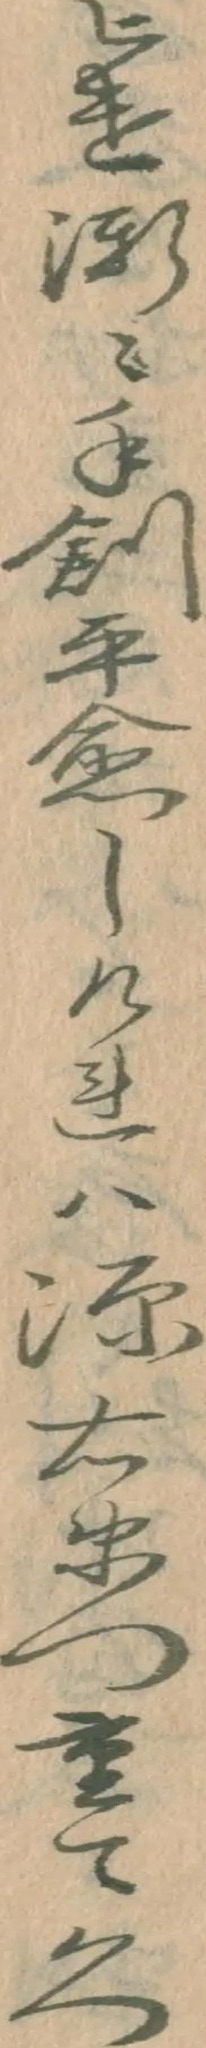被遣漸々手創平愈しけ連は言右衛門重て久

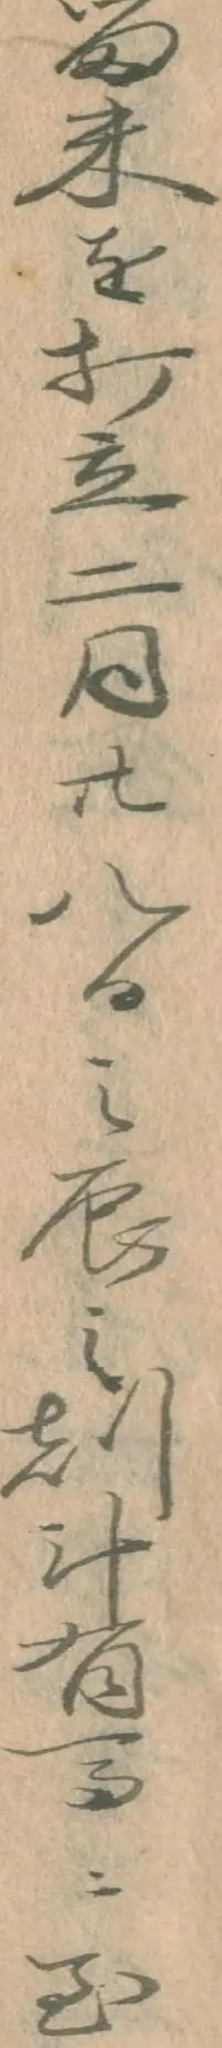留米を打立二月廿八日之辰之刻斗有馬に至
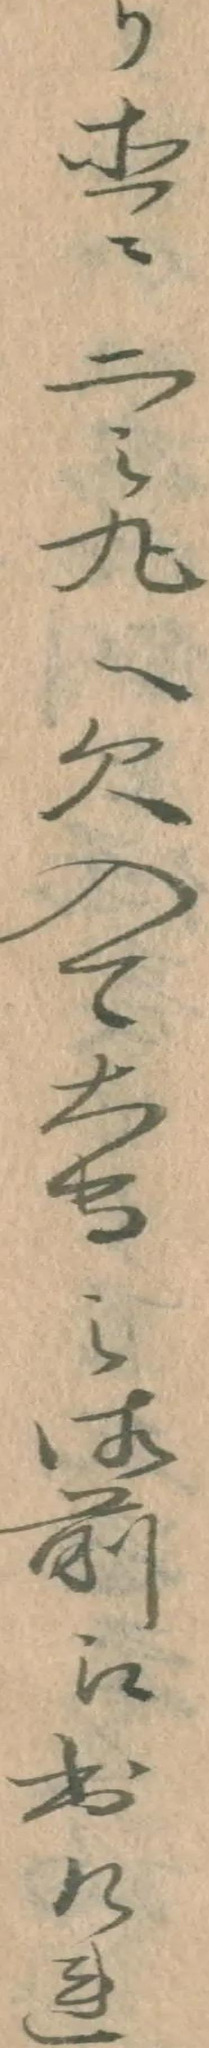り直に二之丸へ欠入て大守之御前江出け連
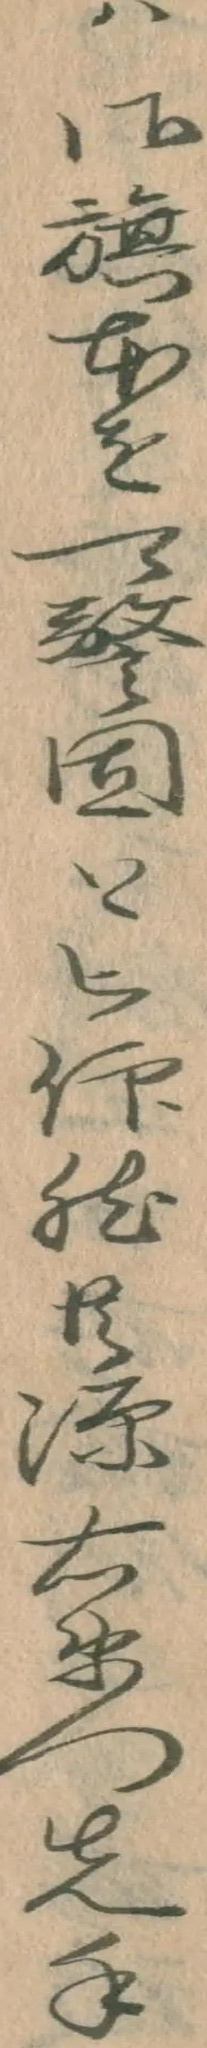は御旗本を可警固と被仰然共源右衛門先手
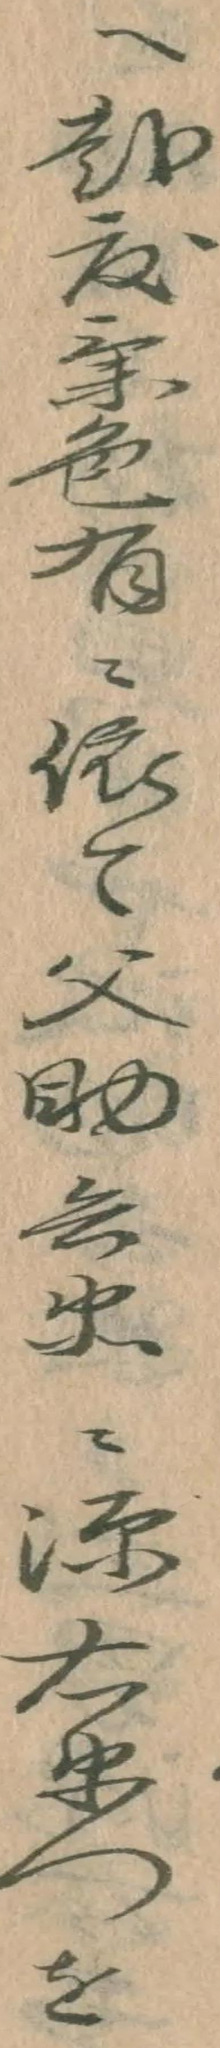へ赴度気色有に依て父助兵衛に源右衛門を
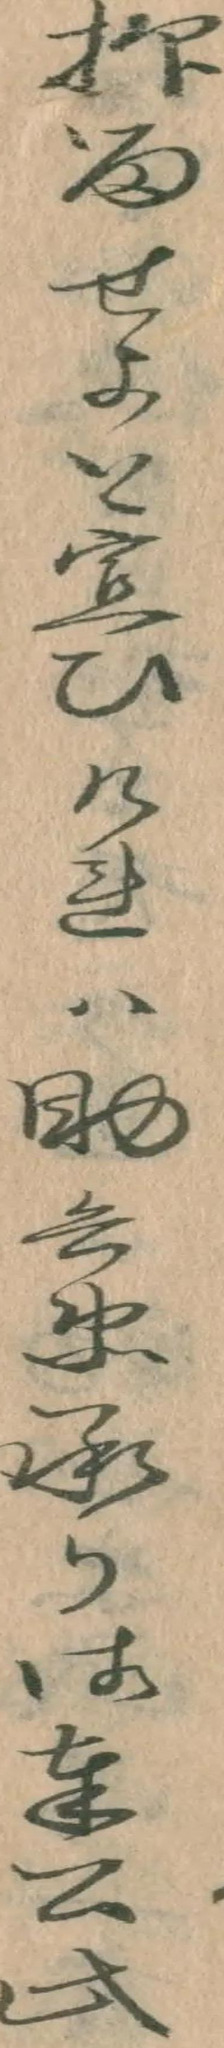抑留せよと宣ひけ連は助兵衛承り御奉公此
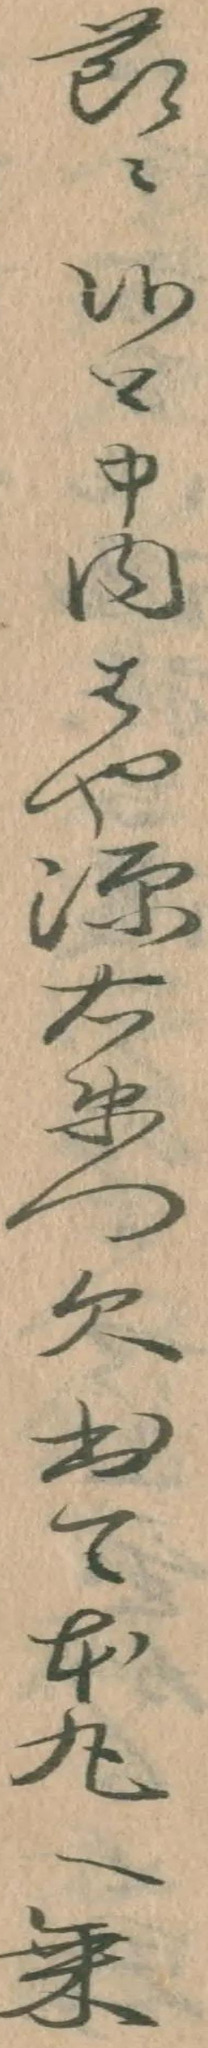節に候と申内者也源右衛門欠出て本丸へ乗
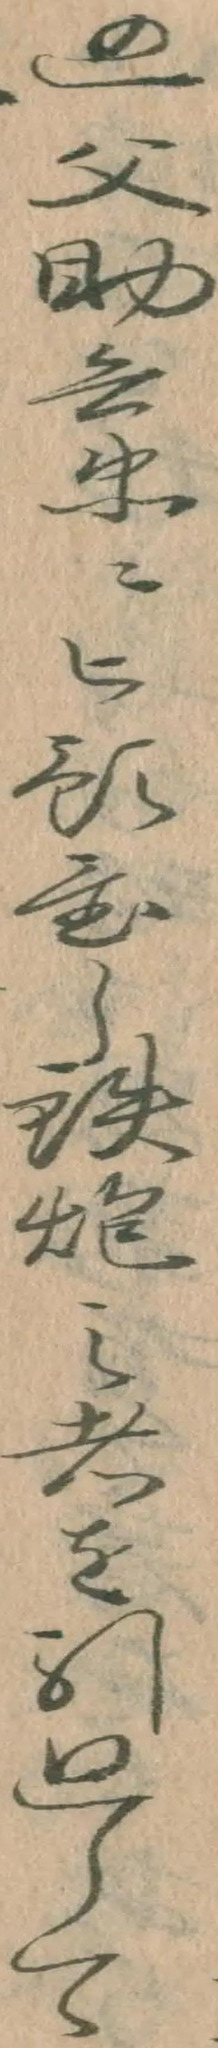込父助兵衛に被預置し鉄砲之者を引廻して
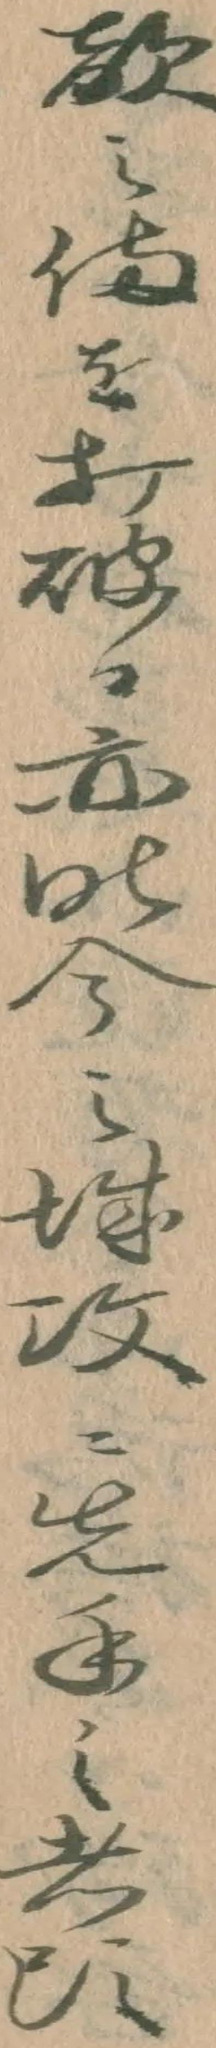敵之備を打破る亦昨今之城攻に先手之者頭
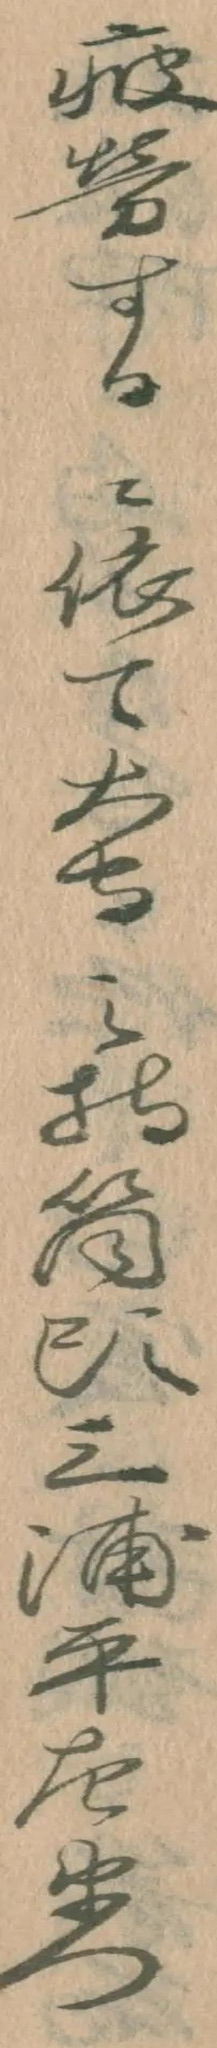疲労するに依て大守之持筒頭三浦平左衛門
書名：切支丹御退治記 49巻. [9]
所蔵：国立国会図書館 National Diet Library, JAPAN
